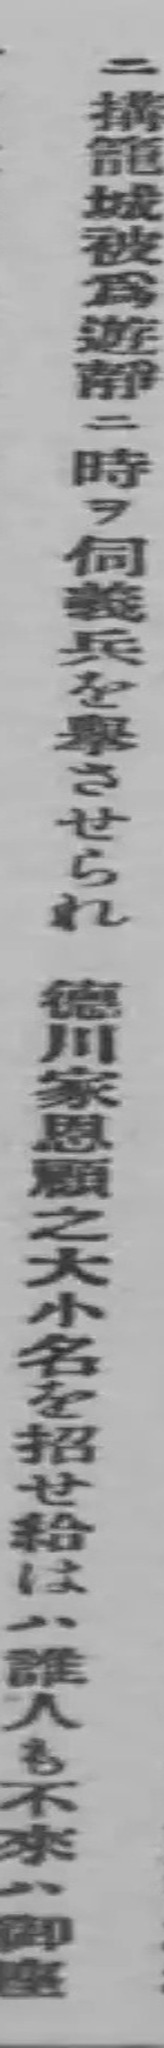ニ搆籠城被為遊静ニ時を伺義兵を挙させられ徳川家恩顧之大小名を招せ給はゝ誰人も不来は御座
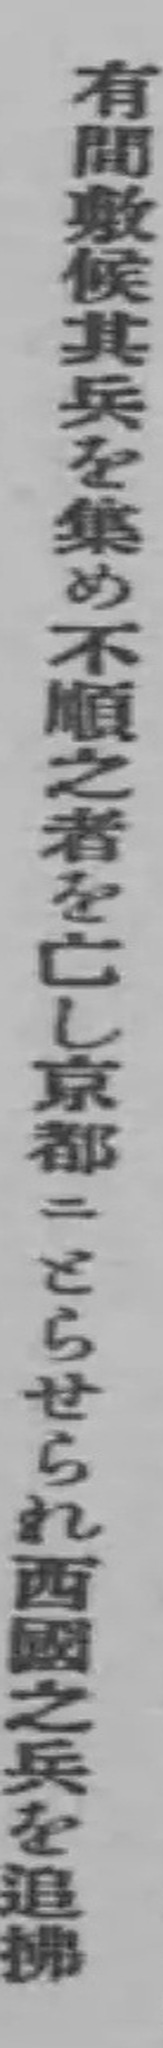有間敷候其兵を集め不順之者を亡し京都ニとらせられ西国之兵を追払
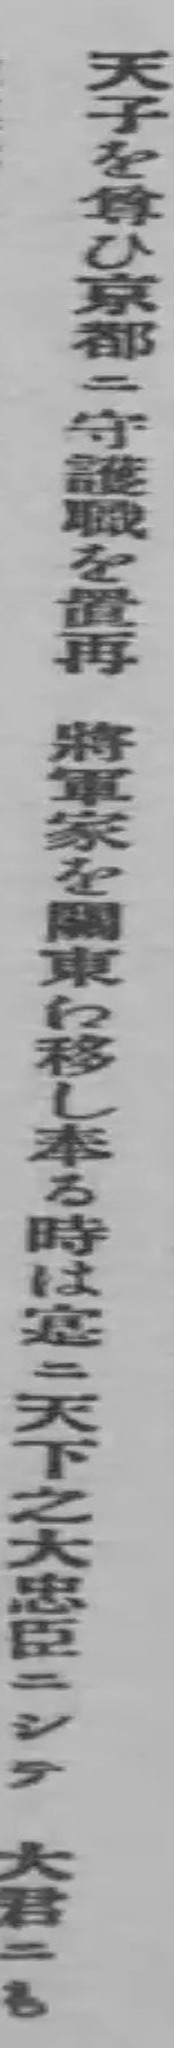天子を尊ひ京都ニ守護職を置再将軍家を関東え移し奉る時は寔ニ天下之大忠臣ニして大君ニも
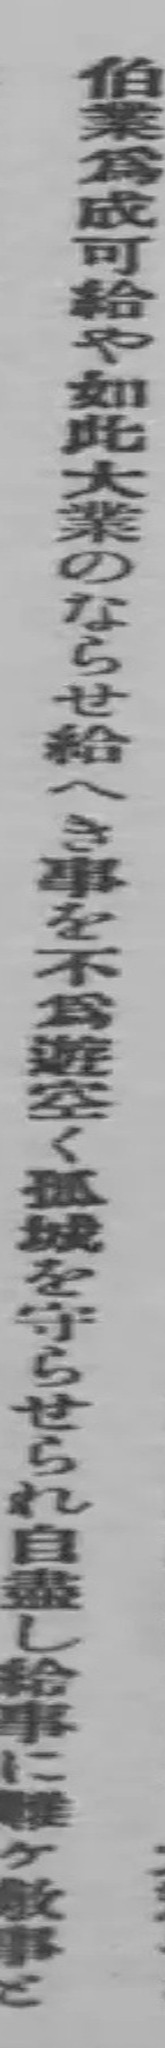伯業為成可給や如此大業のならせ給へき事を不為遊空く孤城を守らせられ自尽し給事に難ケ敷事と
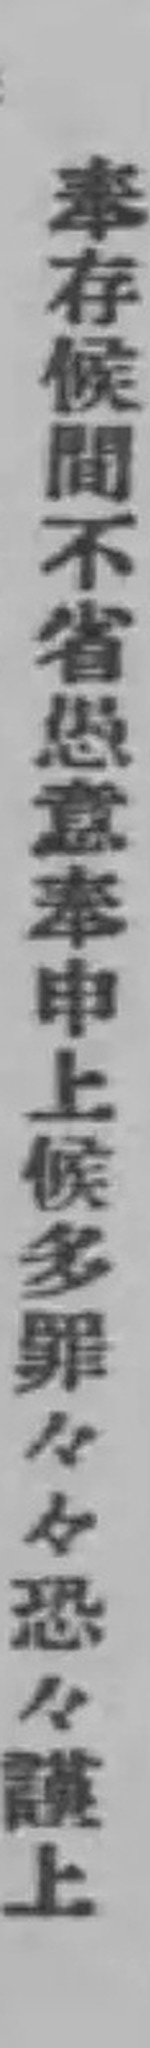奉存候間不省愚意奉申上候多罪々々恐々謹上
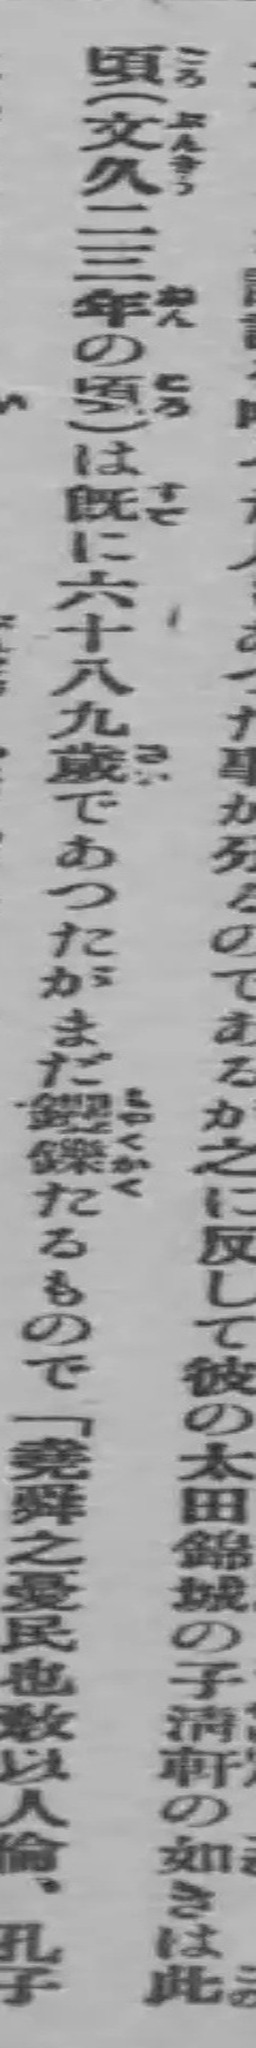頃(文久二三年の頃)は既に六十八九歳であつたがまだ钁鑠たるもので「堯舜之憂民也数以人倫、孔子
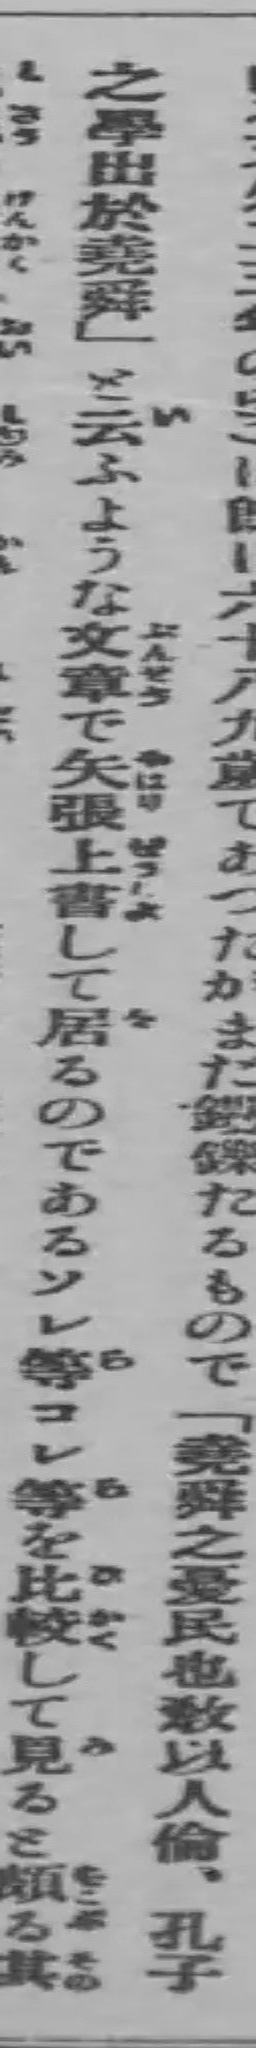之学出於堯舜」と云ふような文章で矢張上書して居るのであるそれ等これ等を比較して見ると頗る其
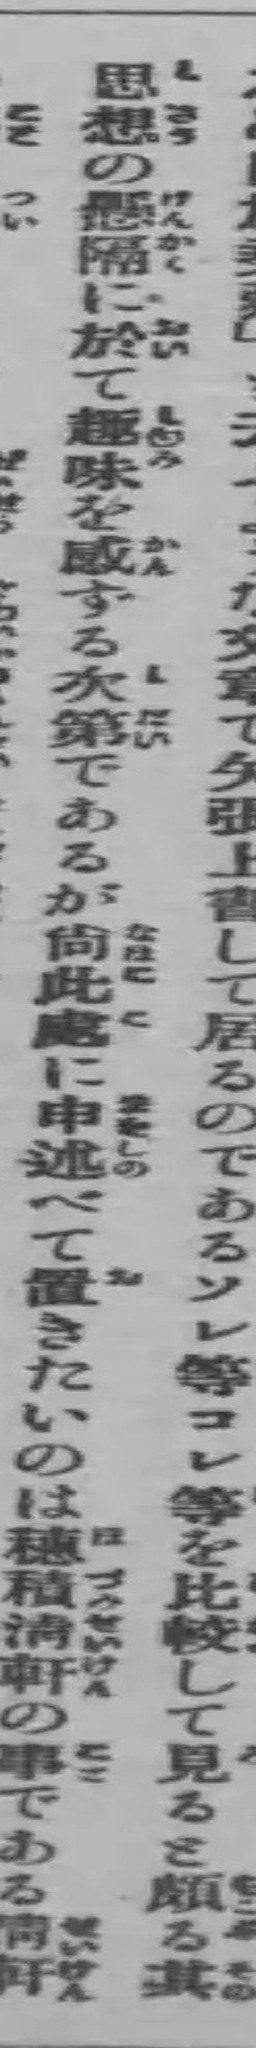思想の懸隔に於て趣味を感ずる次第であるが尚此処に申述べて置きたいのは穂積清軒の事である清軒
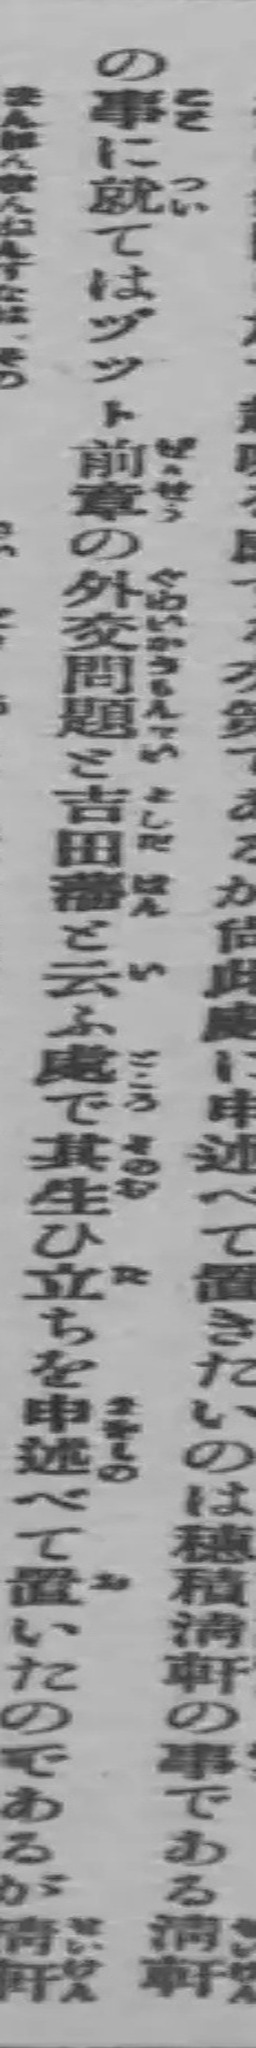の事に就てはヅット前章の外交問題と吉田藩と云ふ処で其生ひ立ちを申述べて置いたのであるが清軒
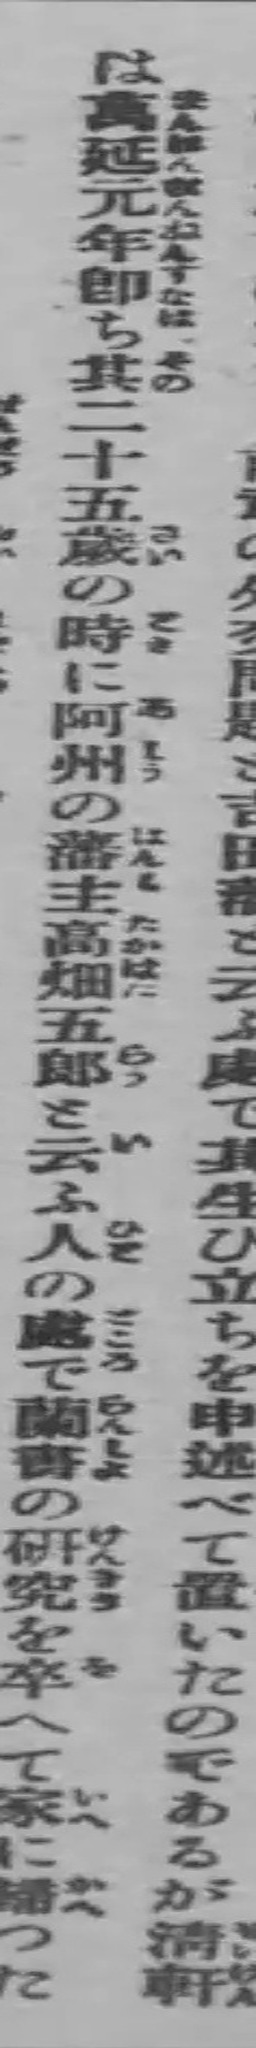は万延元年即ち二十五歳の時に阿州の藩主高畑五郎と云ふ人の処で蘭書の研究を卒へて家に帰つた
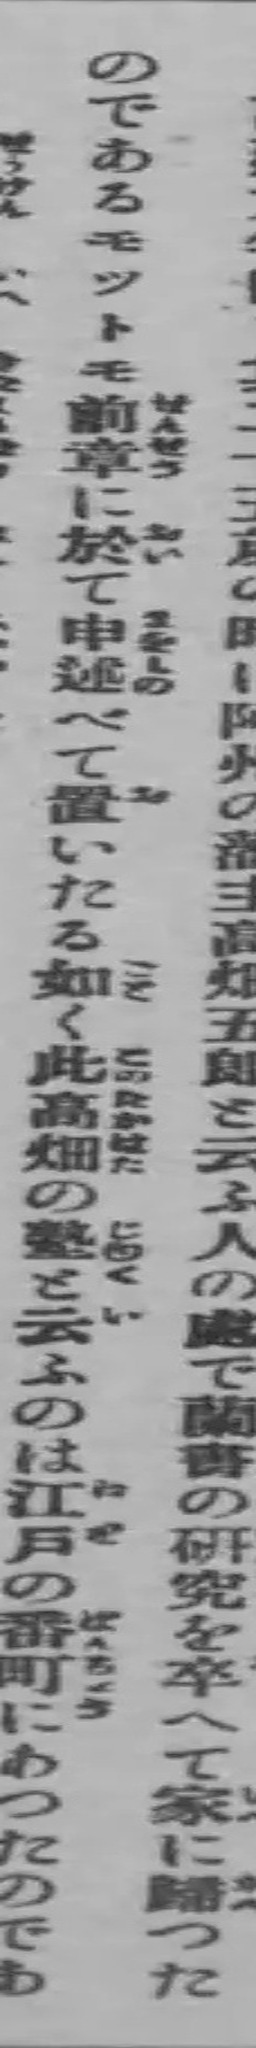のであるモツトモ前章に於て申述べて置いたる如く此高畑の塾と云ふのは江戸の番町にあつたのであ
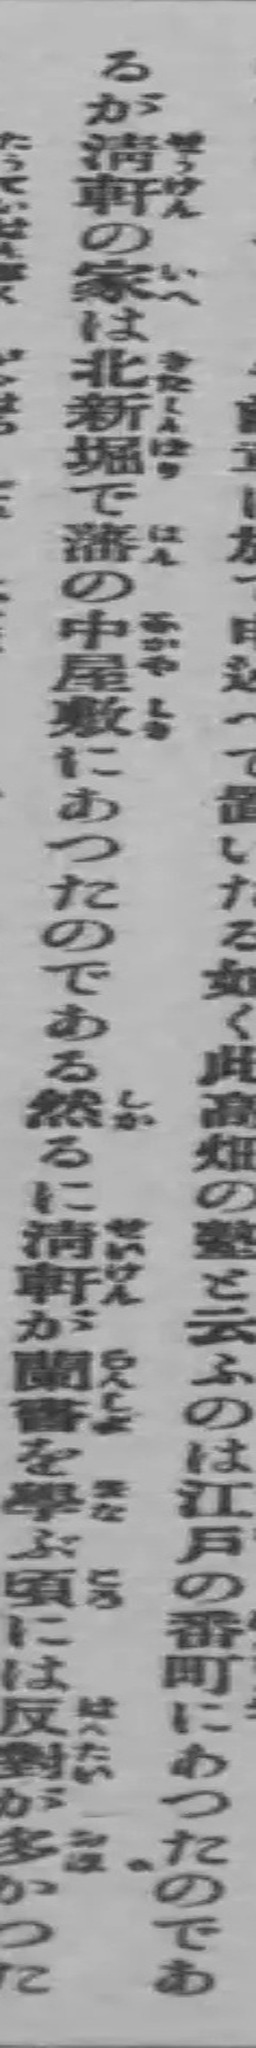るが清軒の家は北新堀で藩の中屋敷にあつたのである然るに清軒が蘭書を学ぶ頃には反対が多かつた
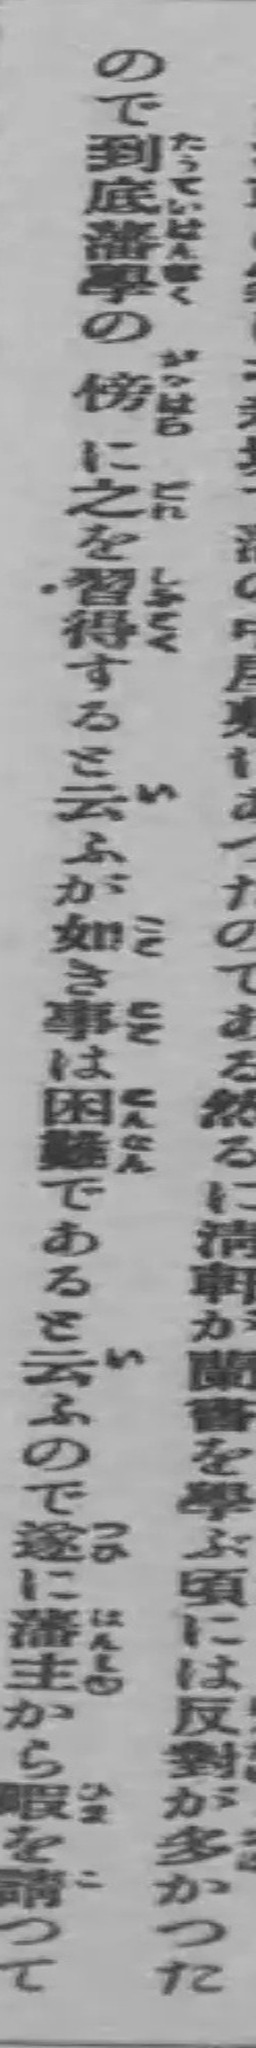ので到底藩学の傍に之を習得すると云ふが如き事は困難であると云ふので遂に藩主から暇を請つて
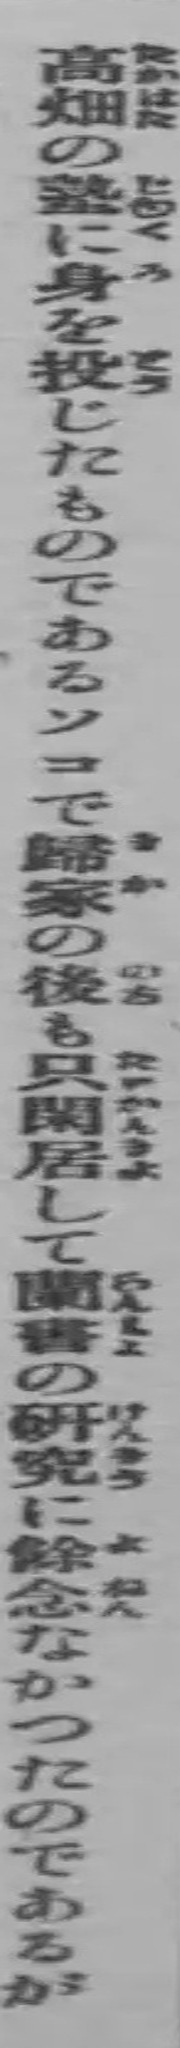高畑の塾に身を投じたものであるソコで帰家の後も只閑居して蘭書の研究に余念がなかつたのであるが
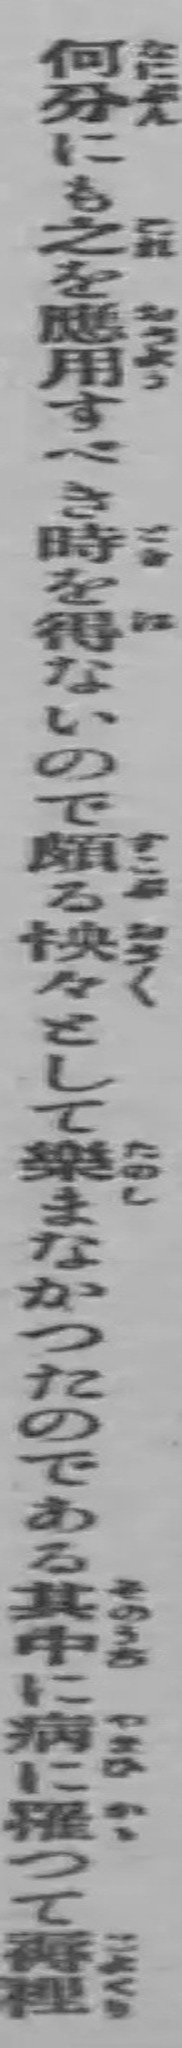何分にも之を応用すべき時を得ないので頗る怏々として楽まなかつたのである其中に病に罹つて褥裡
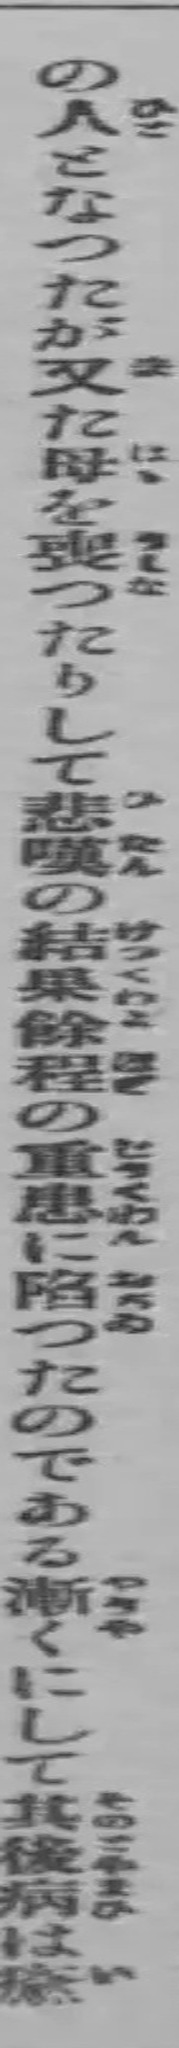の人となつたが又た母を喪つたりして悲嘆の結果余程の重患に陥つたのである漸くにして其後病は癒
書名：豊橋市史談
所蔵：国立国会図書館 National Diet Library, JAPAN
